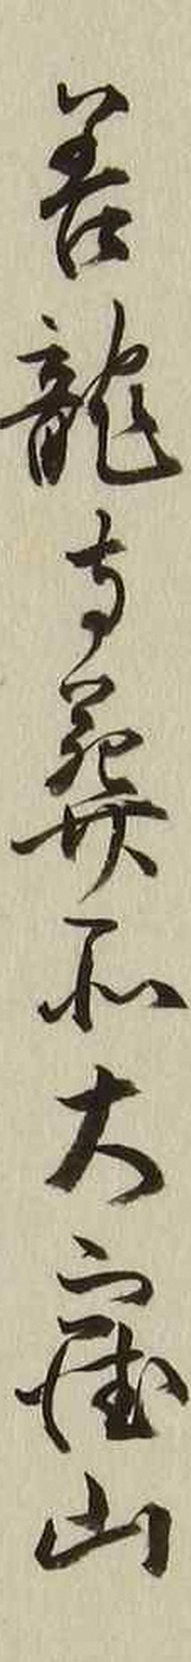善龍寺葬所大窪山
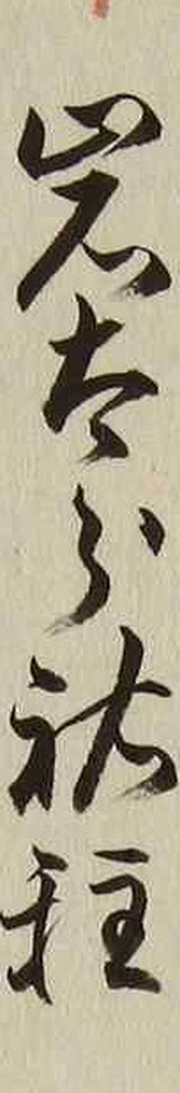岩太郎祐程
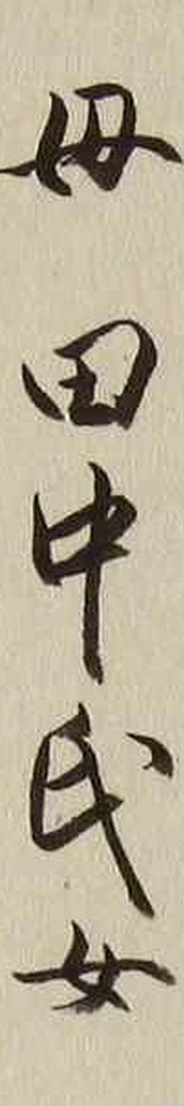母田中氏女
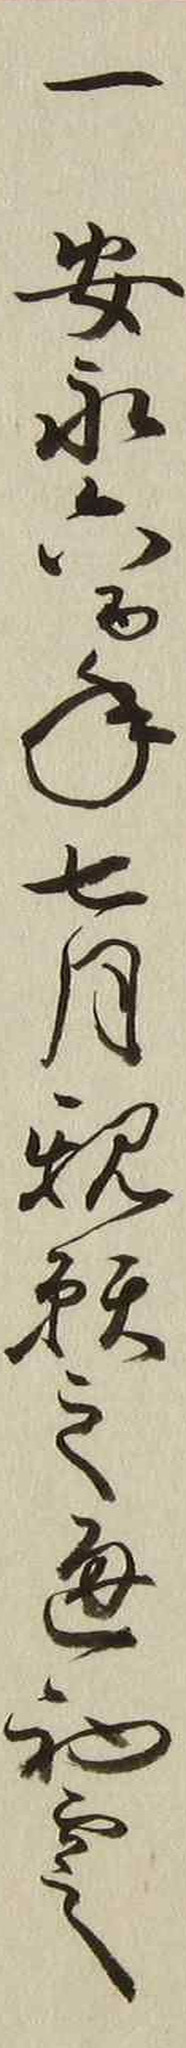一安永六酉年七月親願之通初而之
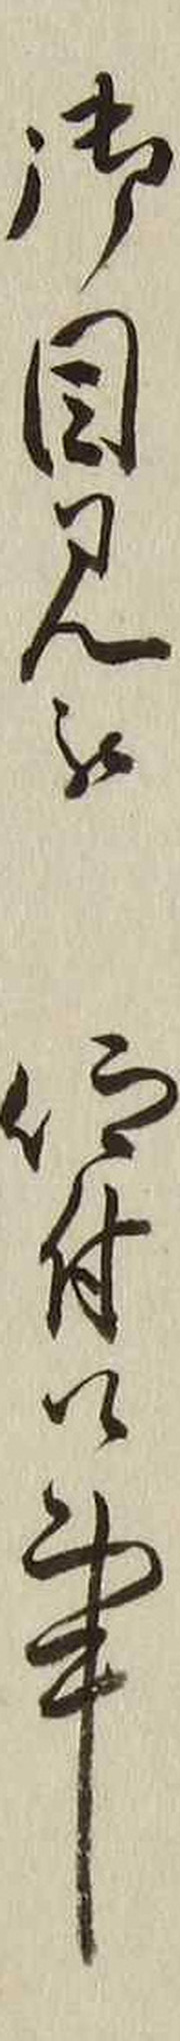御目見被仰付候事
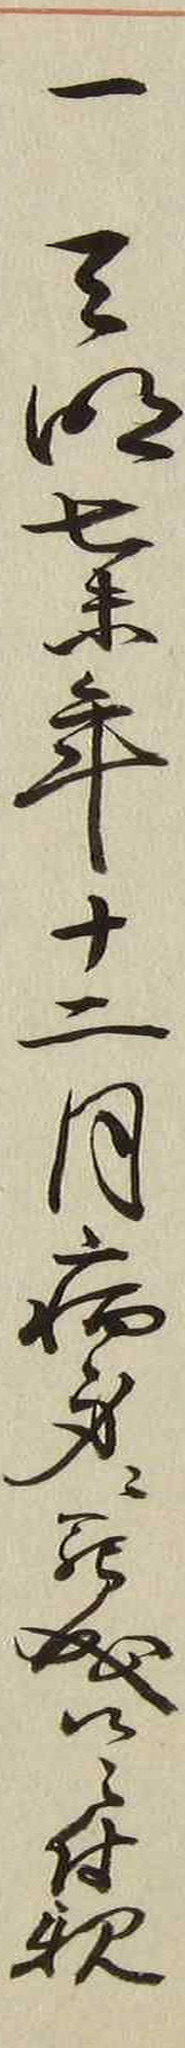一天明七未年十二月病身ニ罷成候ニ付親
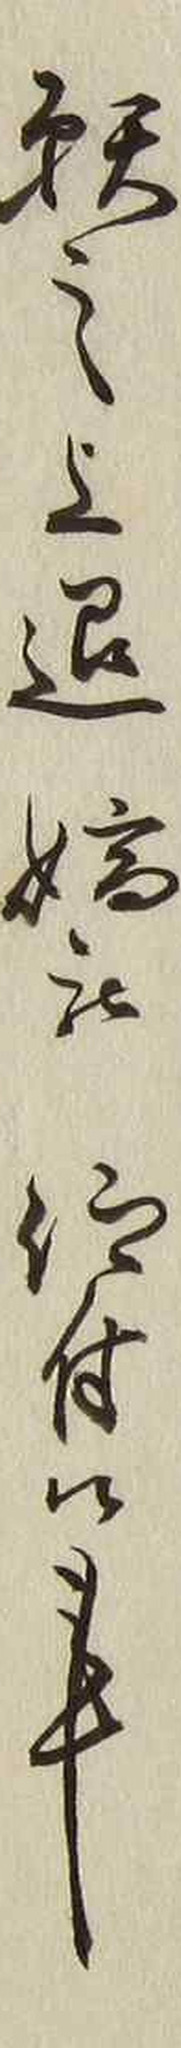願之上退嫡被仰付候事
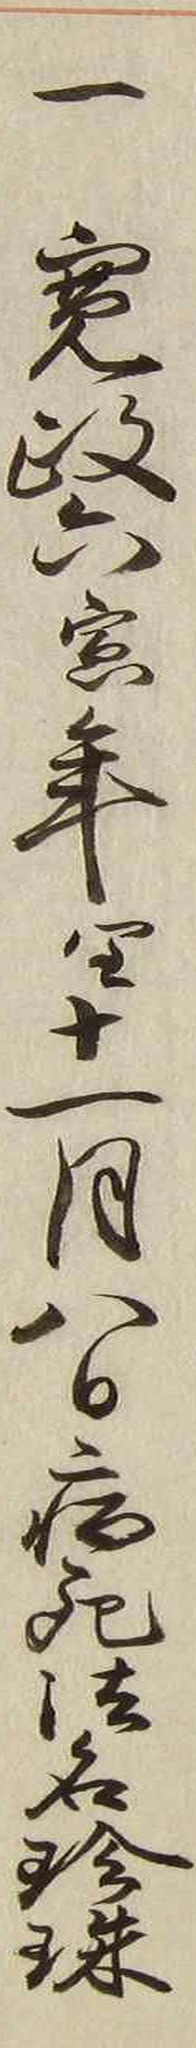一寛政六寅年閏十一月八日病死法名珍珠
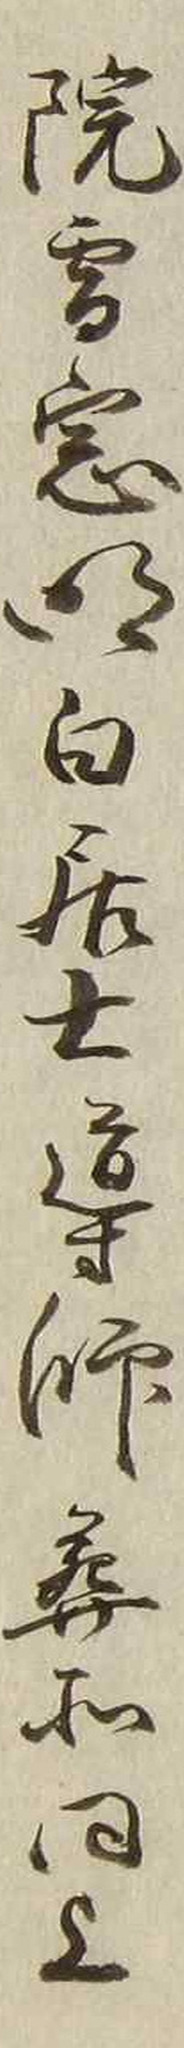院雪窓明白居士導師葬所同上

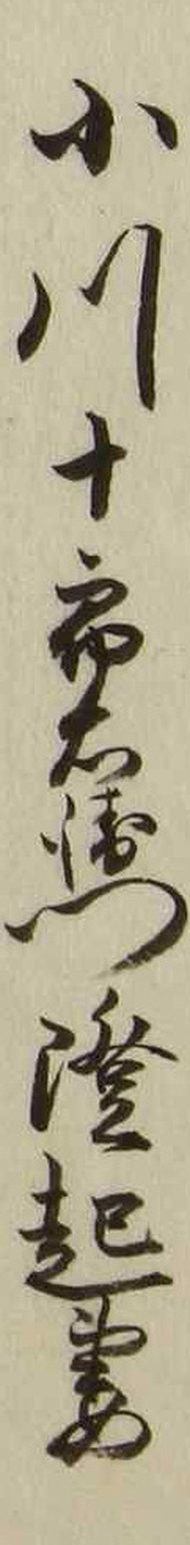小川十郎右衛門隆起妻
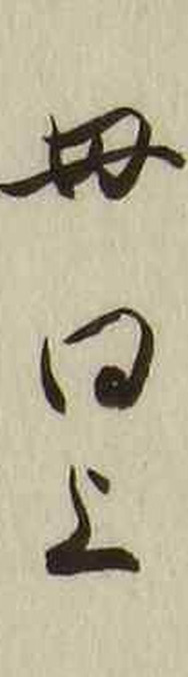母同上
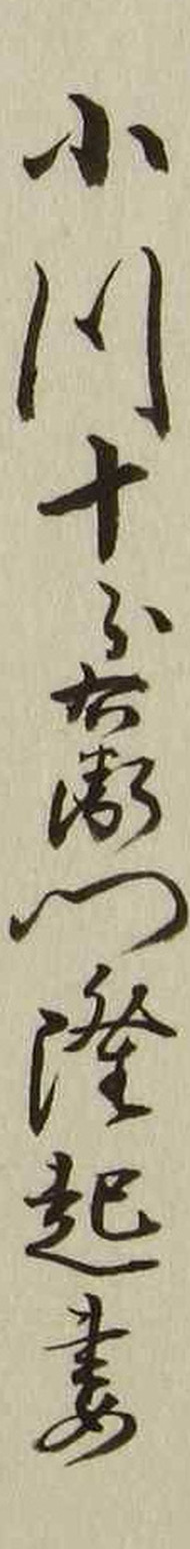小川十郎右衛門隆起妻
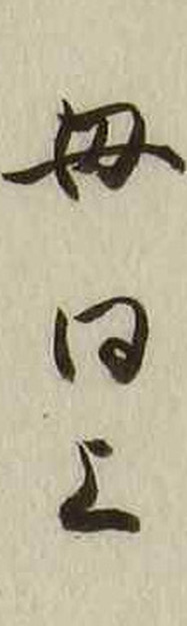母同上
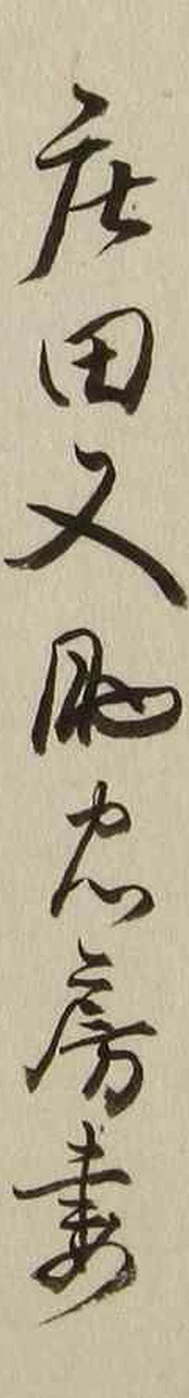女庄田又助忠房妻
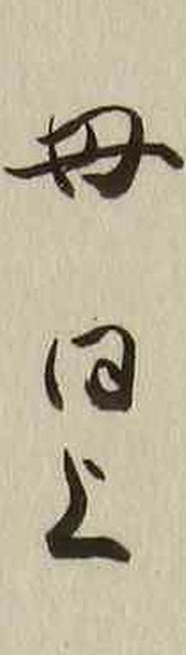母同上
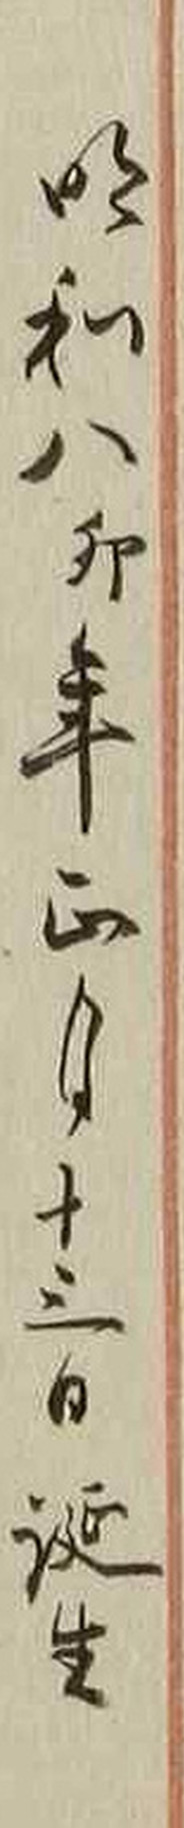明和八卯年正月十三日誕生
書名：諸士系譜　巻之21　い之部21
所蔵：会津若松市立会津図書館
